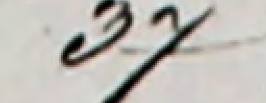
37
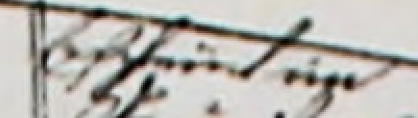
Esseint im
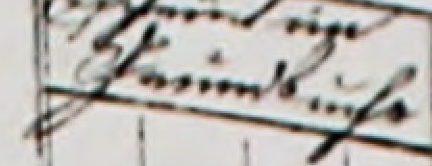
Grundbuche
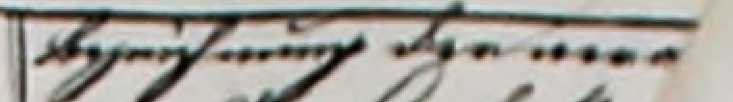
Bezeichnung der erarischen
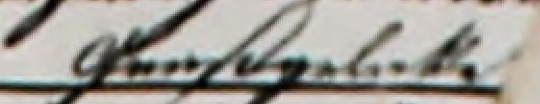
Graßgelake
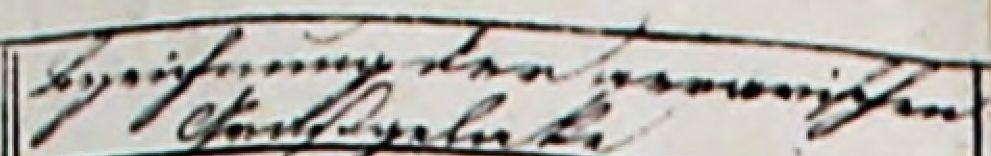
Bezeichnung der erarischen
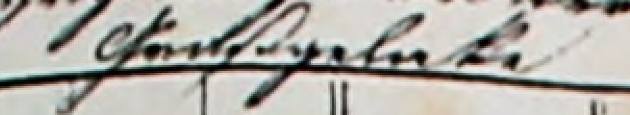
Graßgelake
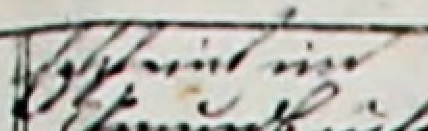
Esseint im
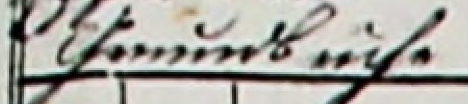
Grundbuche
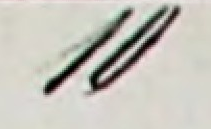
10
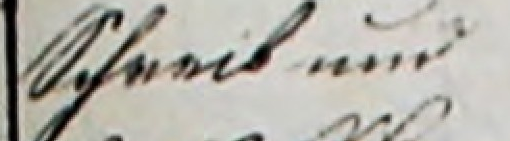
Schreib und
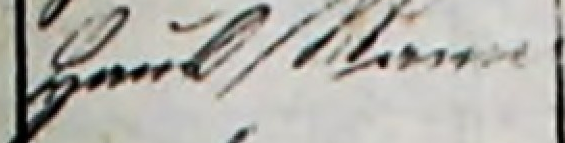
Haus Name
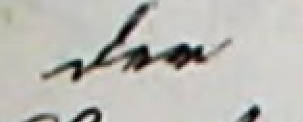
der
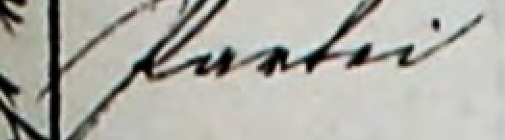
Partei.
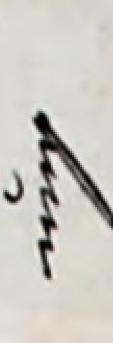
ung
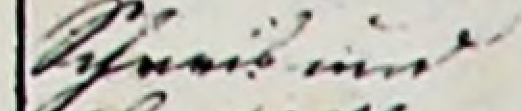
Schreib und
